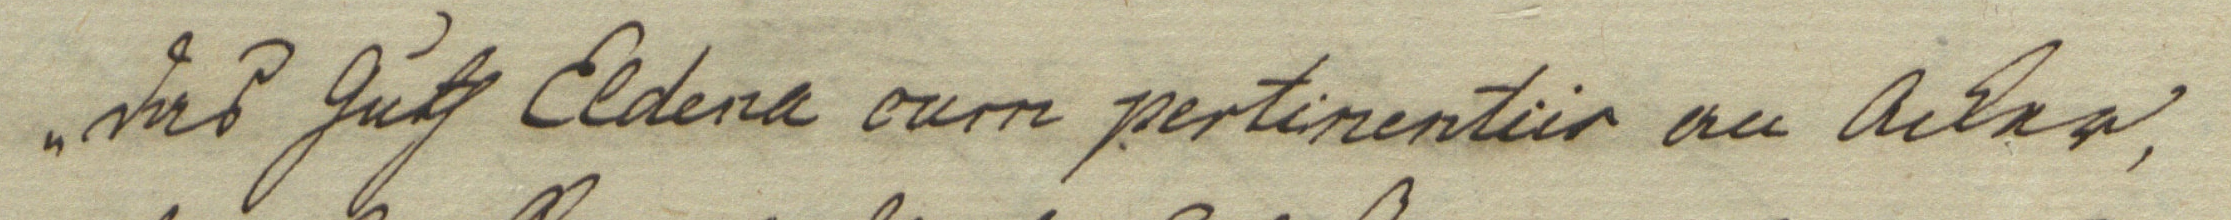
das Guth Eldena cum pertinentiis an Acker,
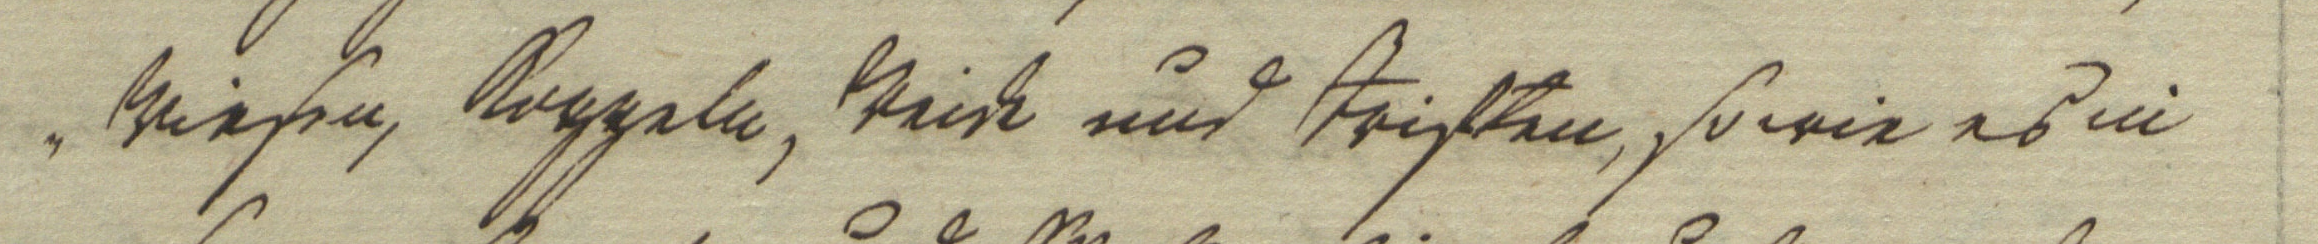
Wiesen, Koppeln, Weide und Triften, so wie es in
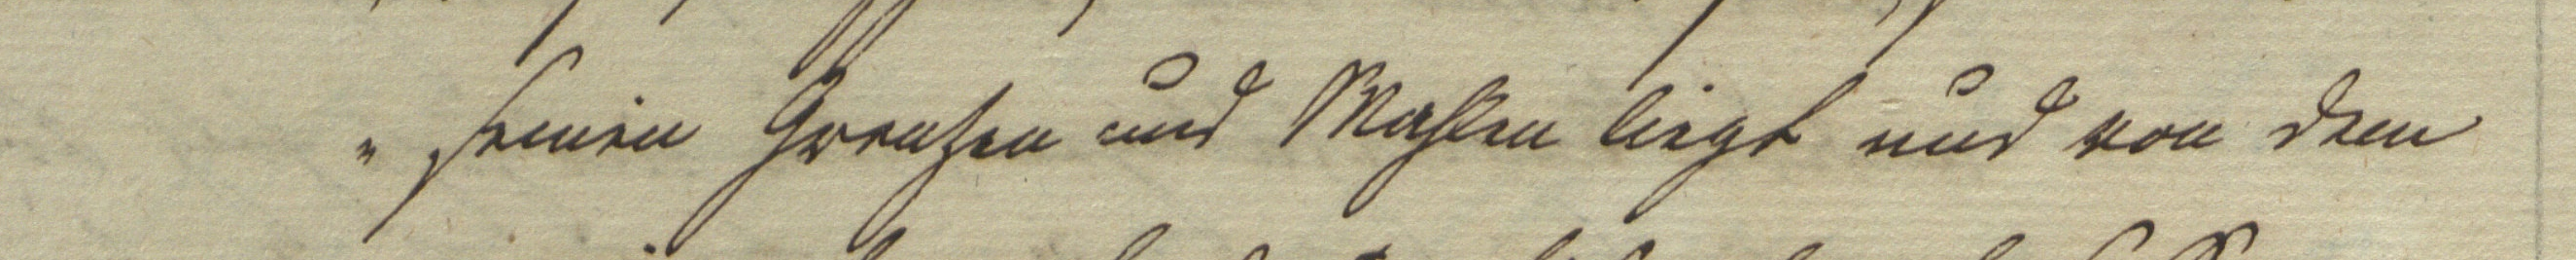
seinen Grenzen und Mahlen liegt und von dem
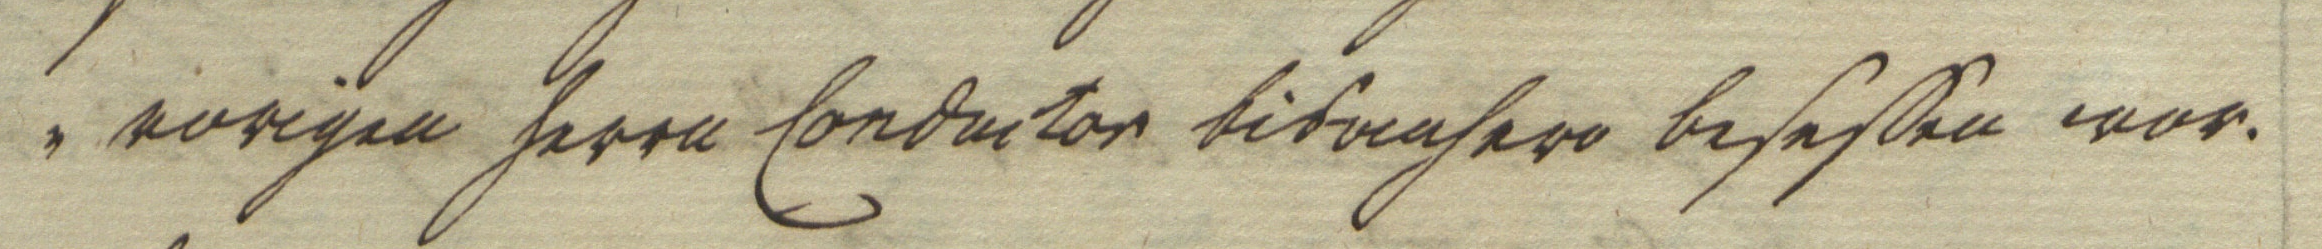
vorigen Herrn Conductor bis anhero besessen wor¬
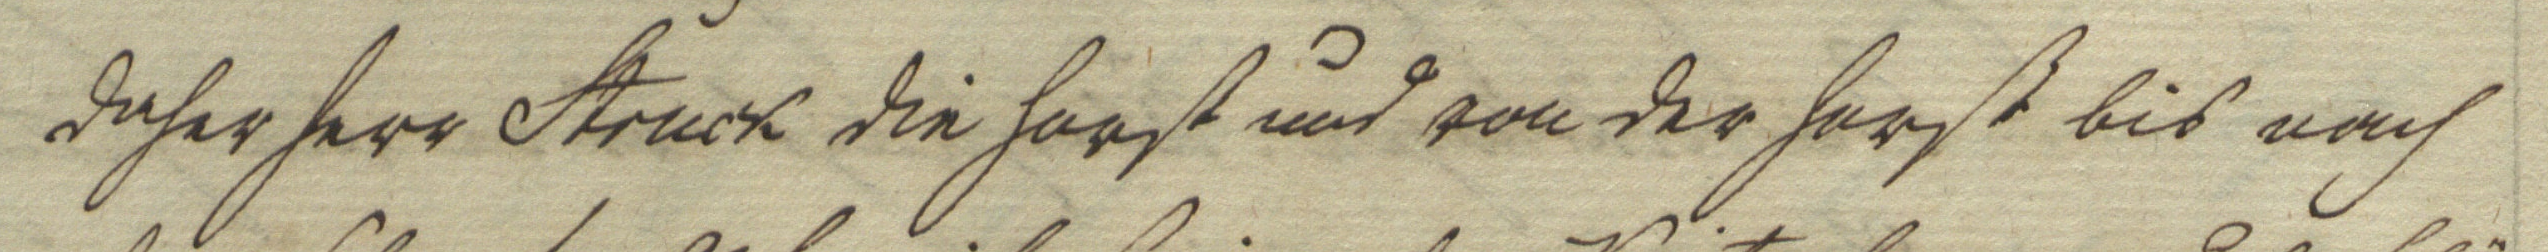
Daher Herr Struck die Horst und von der Horst bis nach
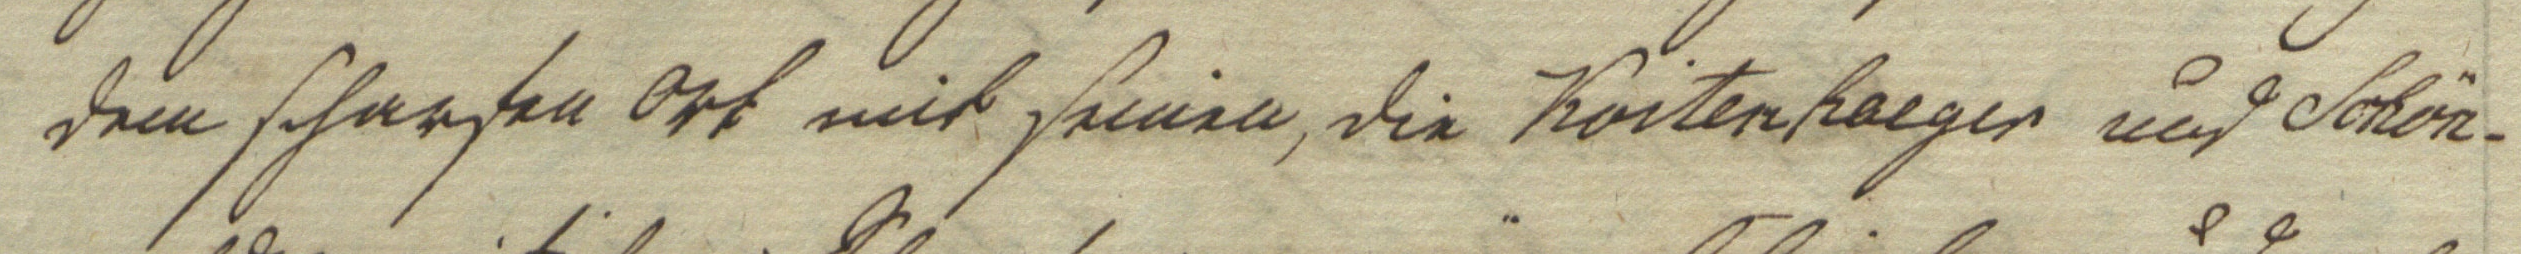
dem scharfen Ort mit seinen, die Koitenhaeger und Schön¬
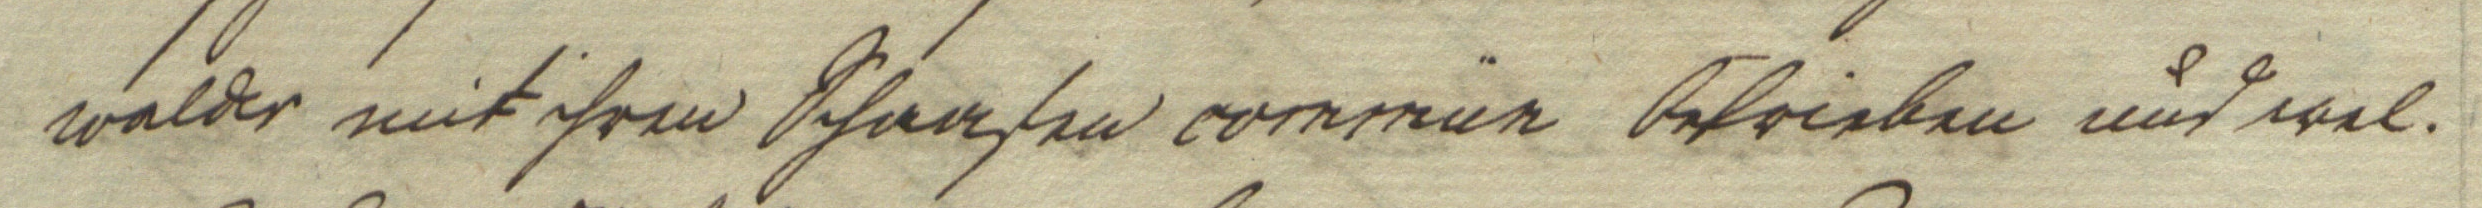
walder mit ihren Schaafen commün betrieben und wel¬
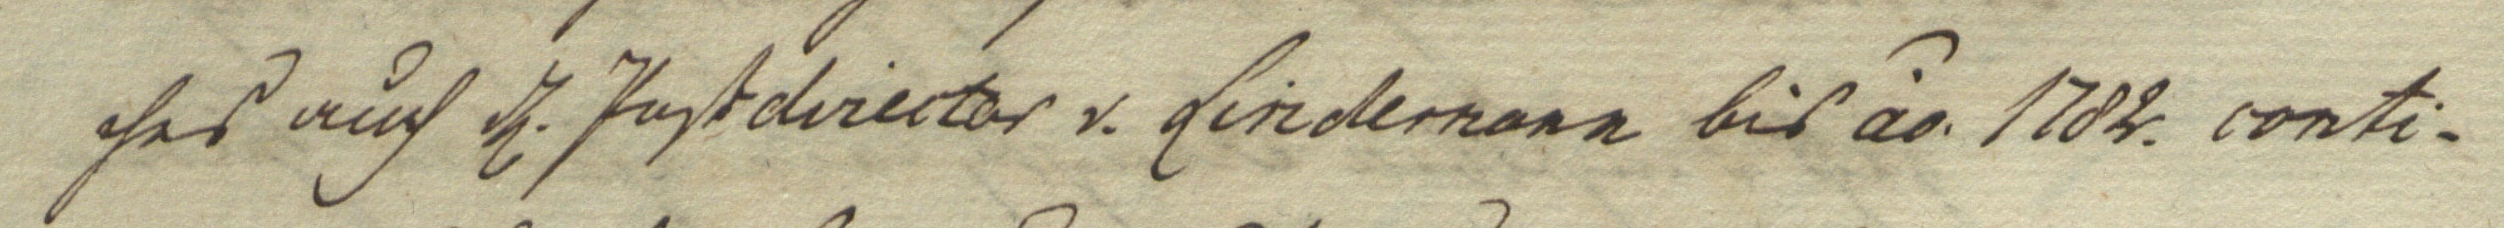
ches auch dh. Postdirector v. Lindemann bis ao. 1782 conti¬
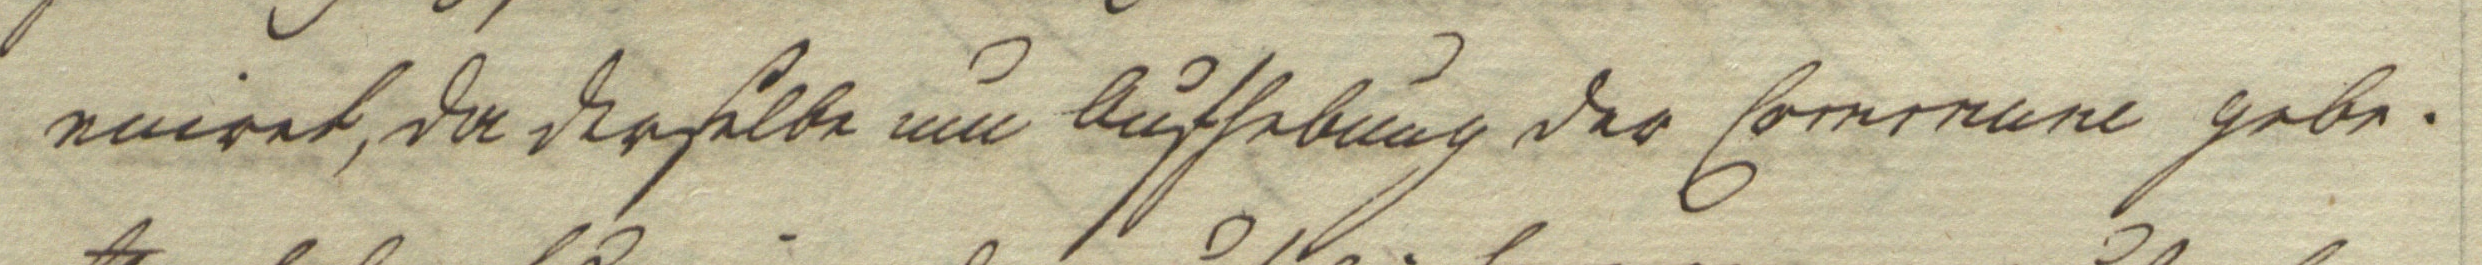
nuiret, da derselbe um Aufhebung der Commune gebe¬
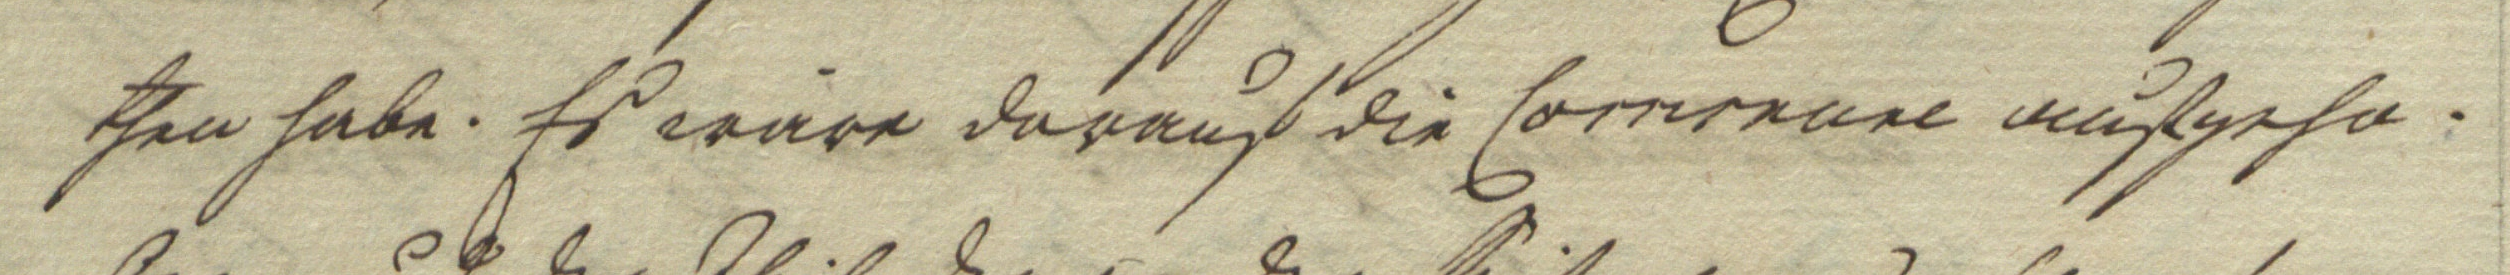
then habe. Es wäre darauf die Commune aufgeho¬
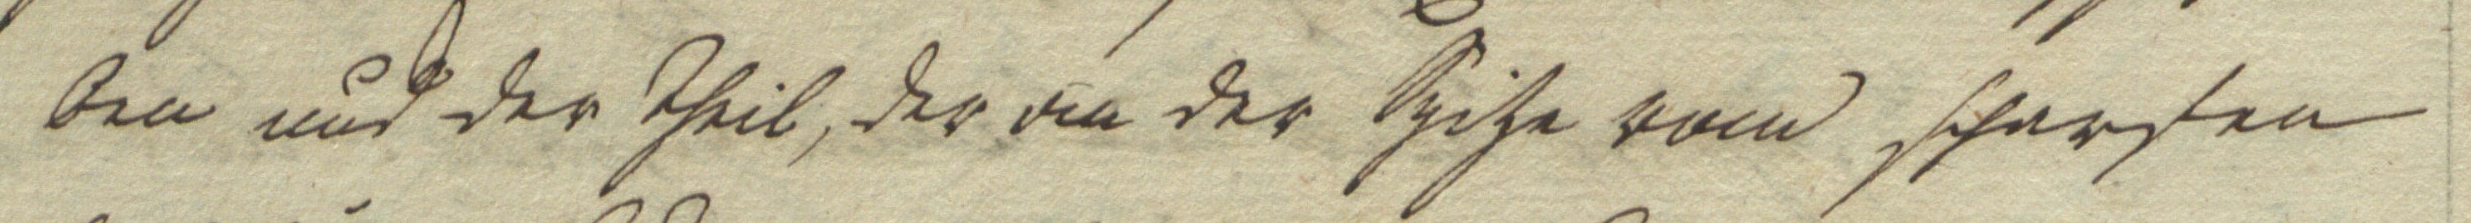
ben und der Theil, der an der Spitze vom scharfen
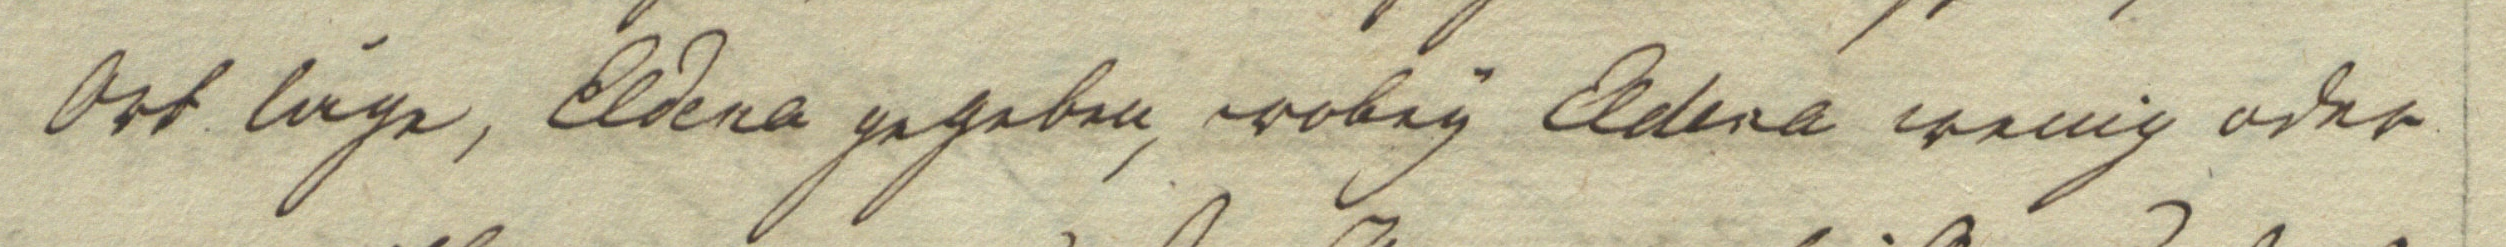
Ort läge, Eldena geben, wobey Eldena wenig oder
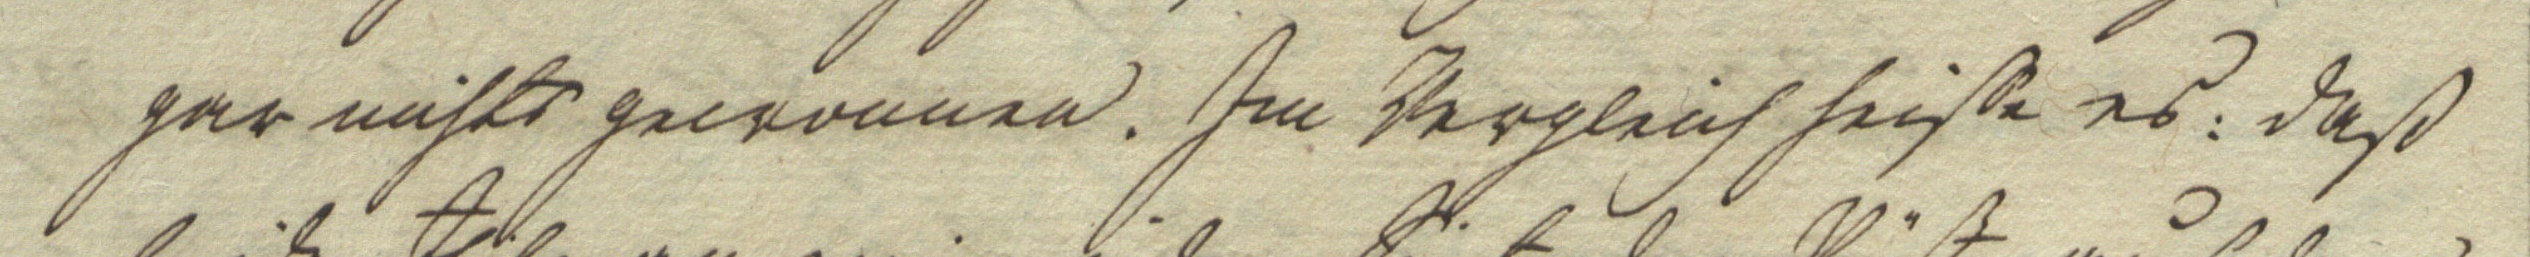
gar nichts gewonnen. Im Vergleich heisse es: daß
